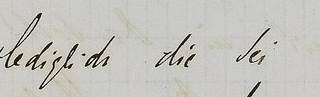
lediglich die sei
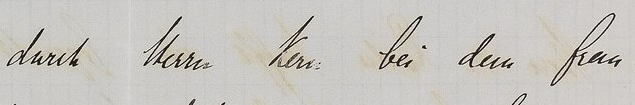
durch Herrn Kern bei dem fran-
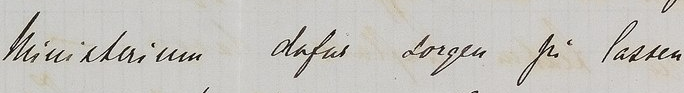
Ministerium dafür sorgen zu lassen,
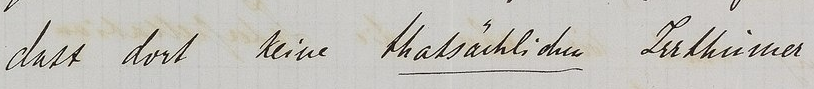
dass dort keine thatsächlichen Irrthümer
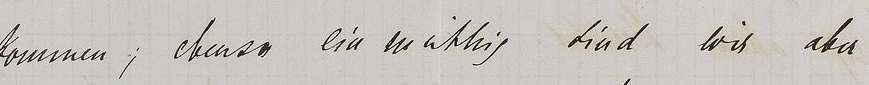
kommen; ebenso einmüthig sind wir aber
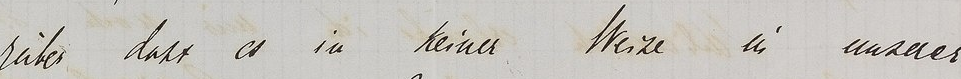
rüber dass es in keiner Weise in unserer
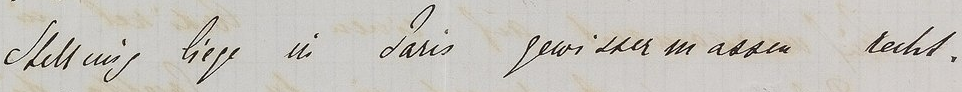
Stellung liege in Paris gewissermassen recht-
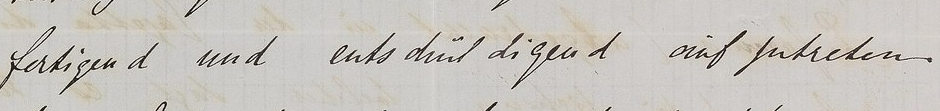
fertigend und entschuldigend aufzutreten.
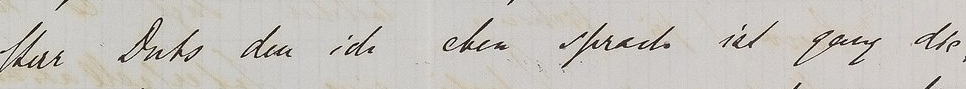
Herr Dubs den ich eben sprach ist ganz die-
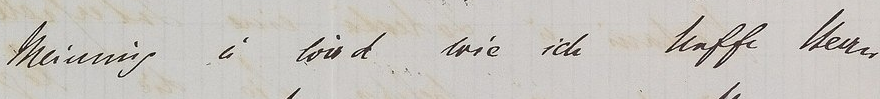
Meinung u wird wie ich hoffe Herrn
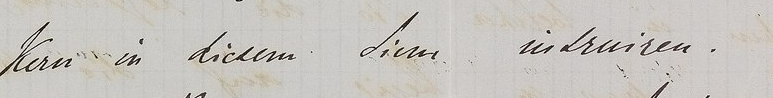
Kern in diesem Sinne intruiren .
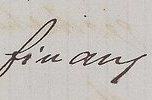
Verhandlungen
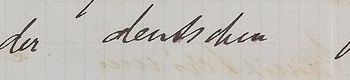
der deutschen
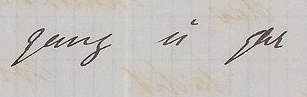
ganz u gar
